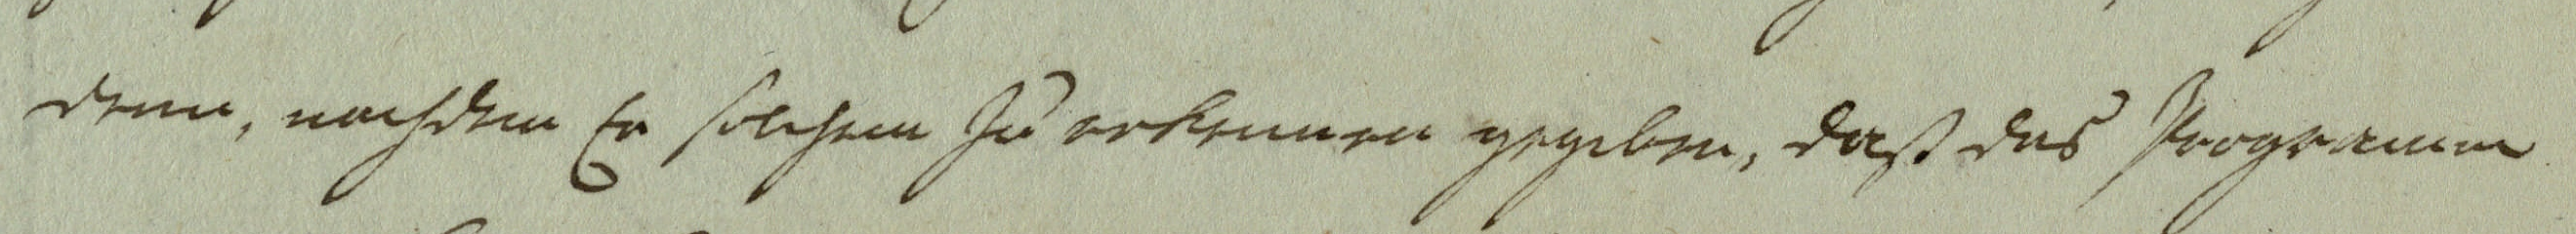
denn, nachdem Er solchem zu erkennen gegeben, daß das Programm
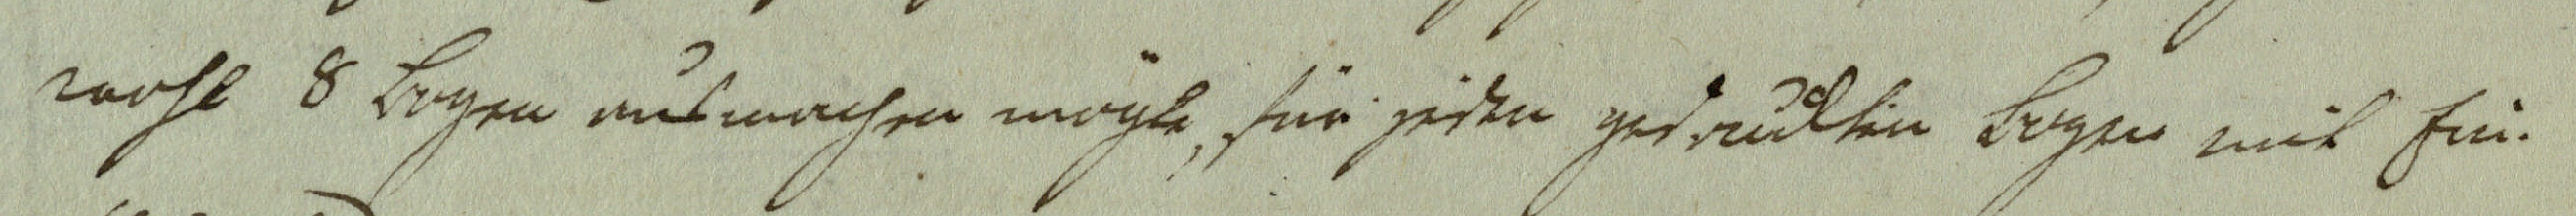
wohl 8 Bogen ausmachen mögte, für jeden gedruckten Bogen mit Ein¬
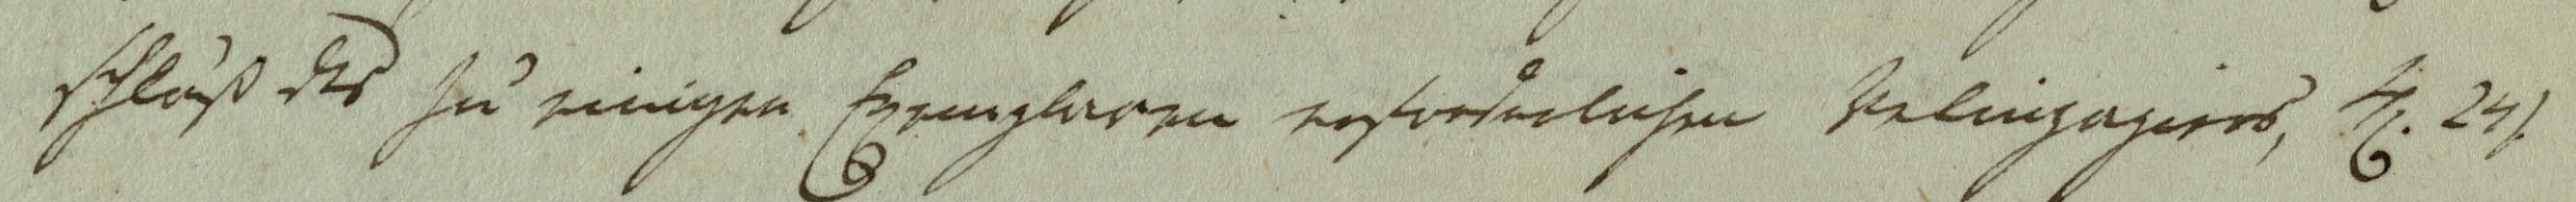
schluß des zu einigen Exemplaren erforderlichen Velinpapires, 4l. 24s.
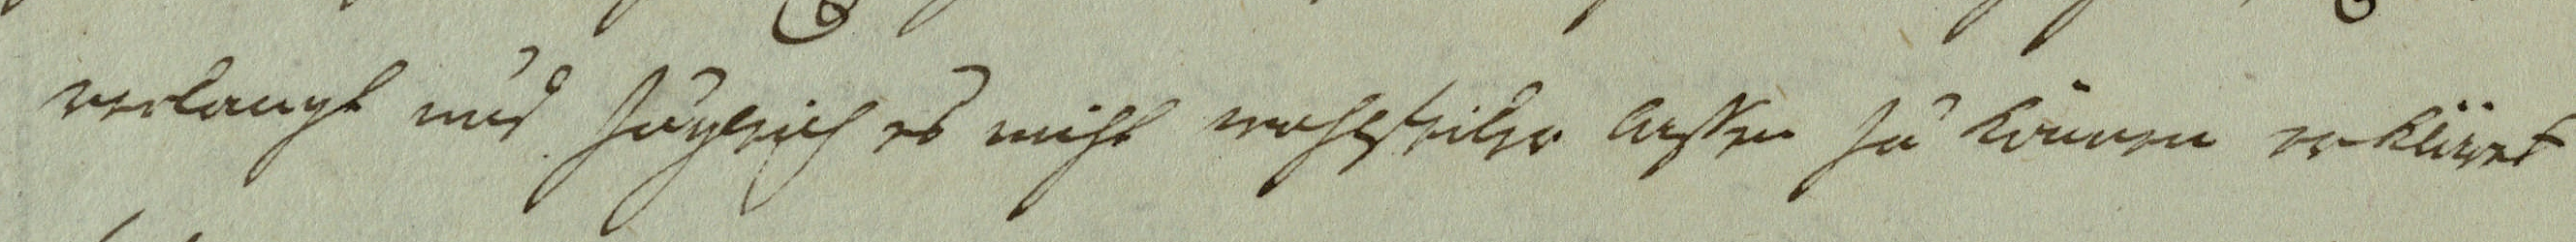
verlangt und zugleich es nicht wohlfeiler lassen zu können erkläret
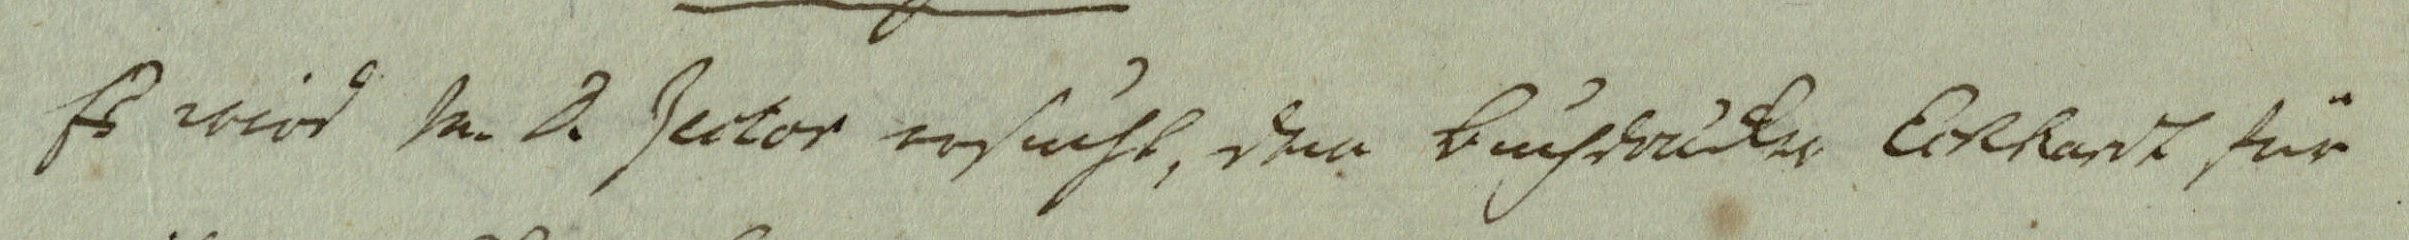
Es wird M. D. Rector ersucht, dem Buchdrucker Eckhardt für
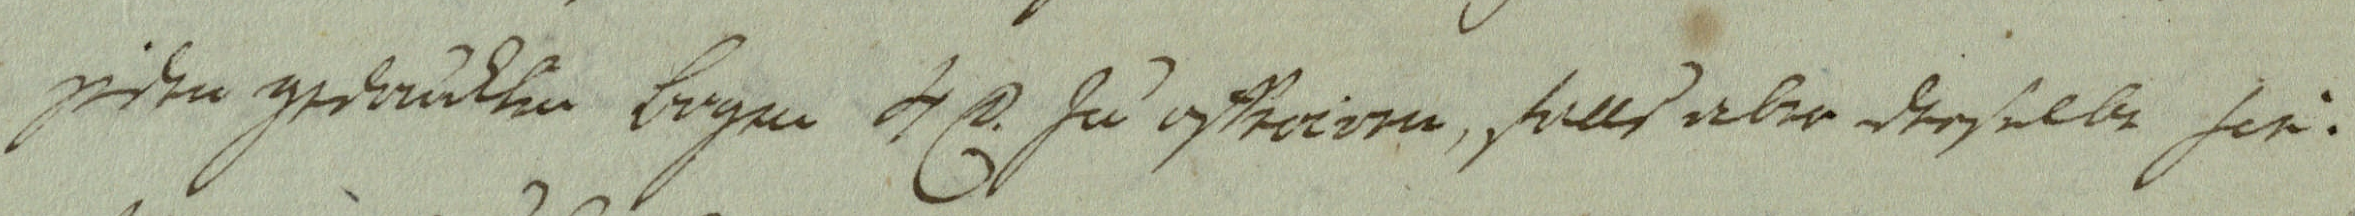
jeden gedruckten Bogen 4l. zu offeriren, falls aber derselbe hie¬
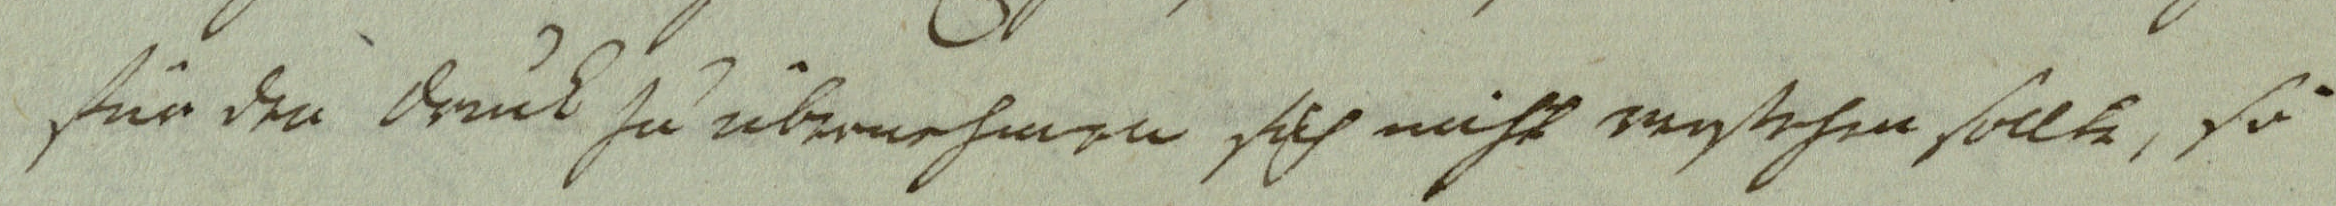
für den Druck zu übernehmen sich nicht verstehen sollte, so
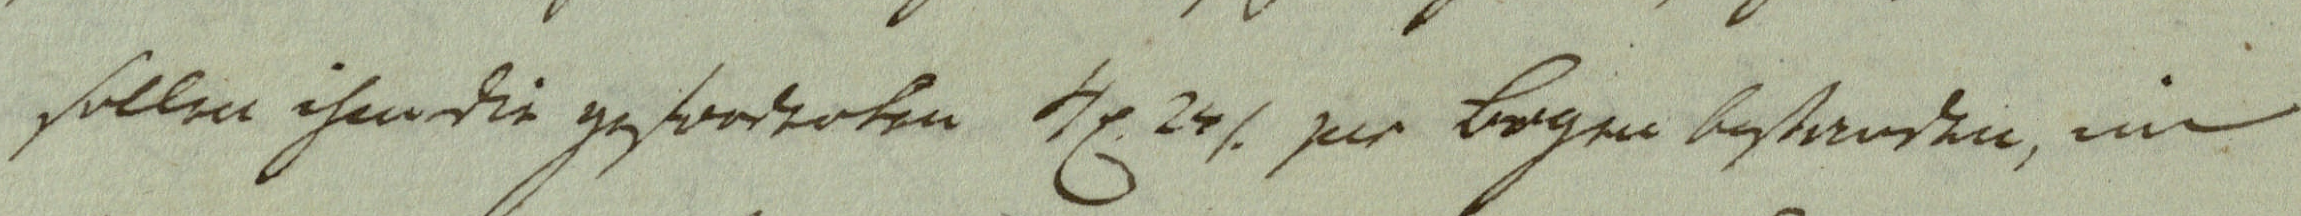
sollen ihm die geforderten 4l. 24 s. per Bogen bestanden, im
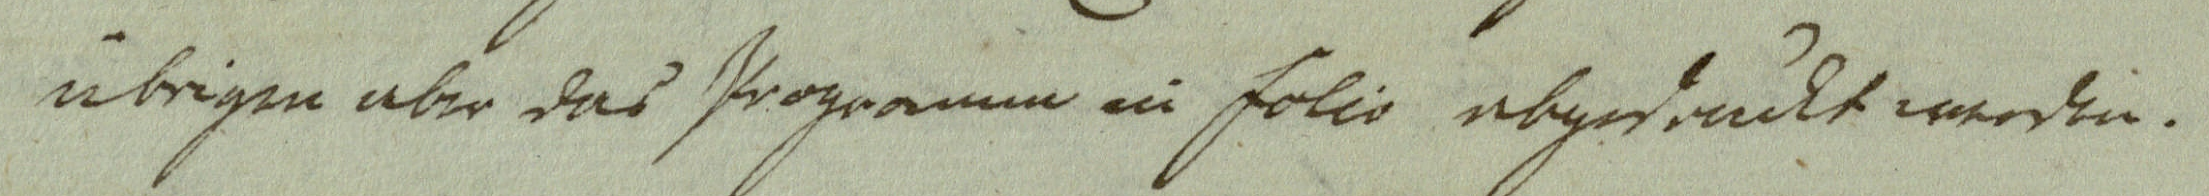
übrigen aber das Programm in Folio abgedruckt werden.
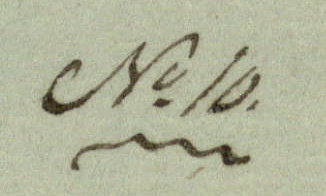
Nº 10.
